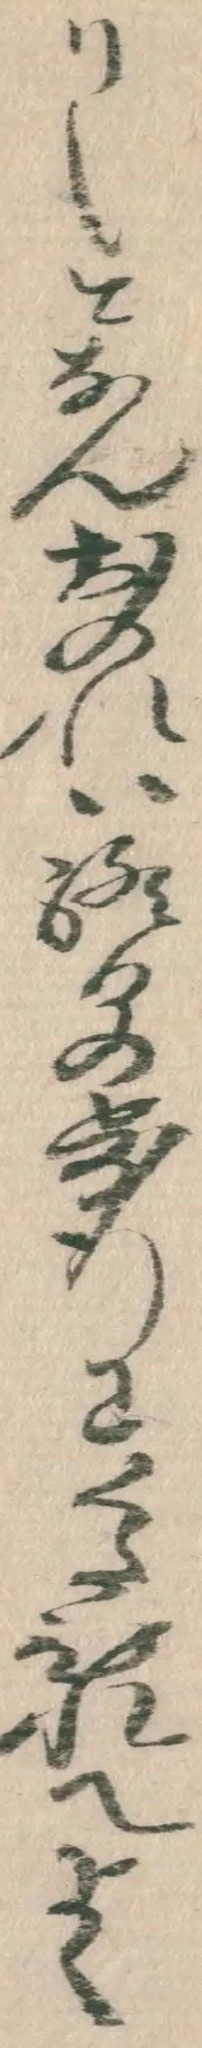りしとなんおのれは終日の歩行にくたひれてよく
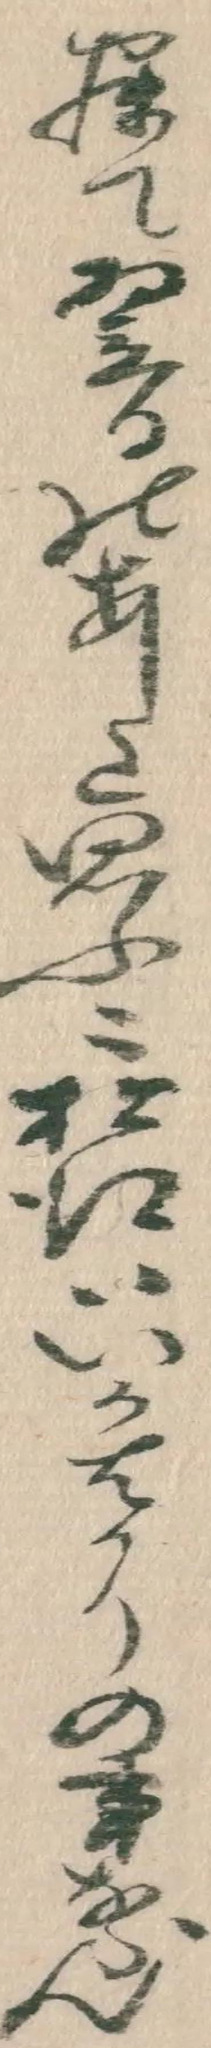寝て翌日のあした思ふに松江はいかはかりの事ならん
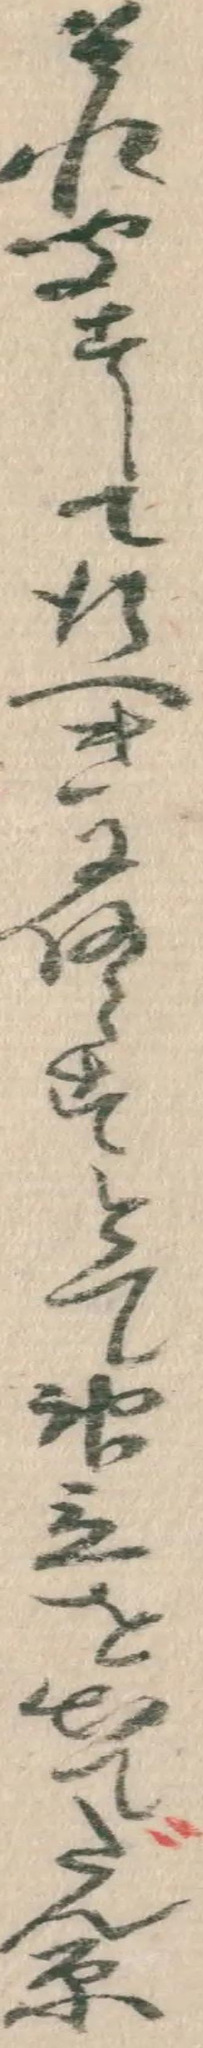それ聞すして行へきにあらすとて神立を出てだん原
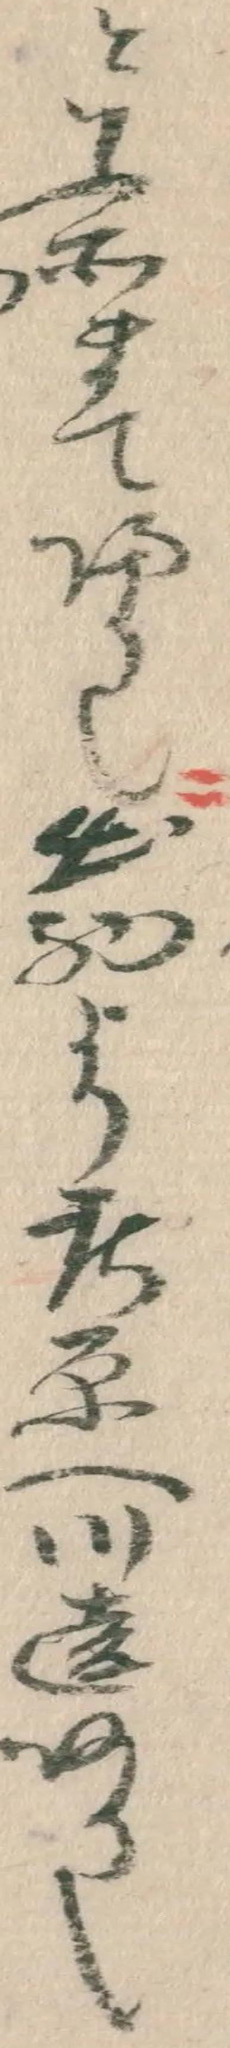といふ所まて帰りしに出西より庄原へ川違ありし
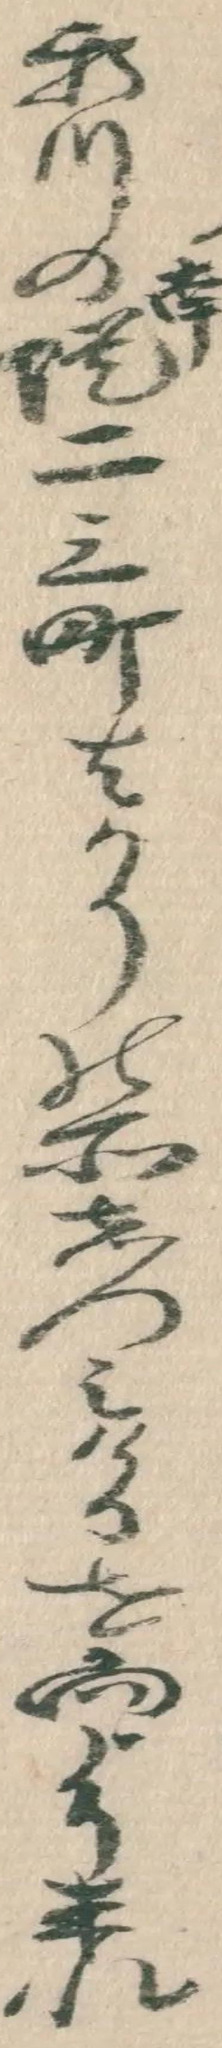新川の南堤二三町はかりの所しつみけるを向より来れ
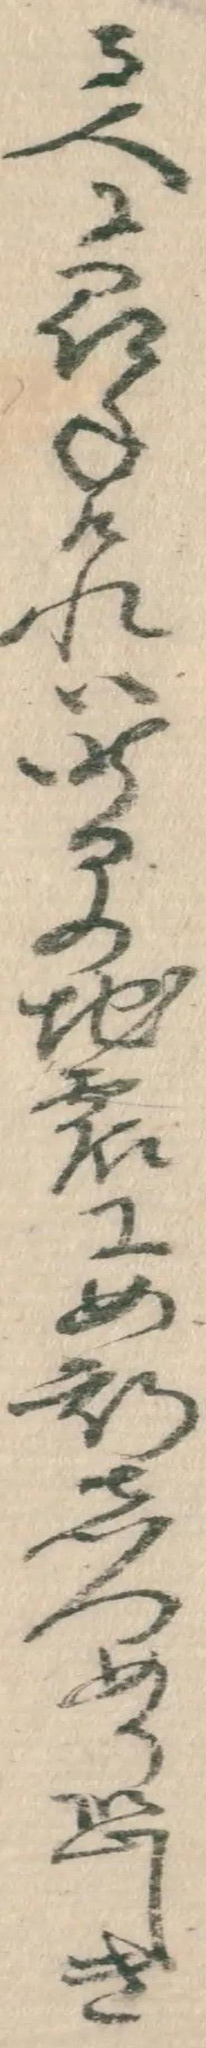る人に尋ねけれは昨日の地震に如斯しつめり恐しき
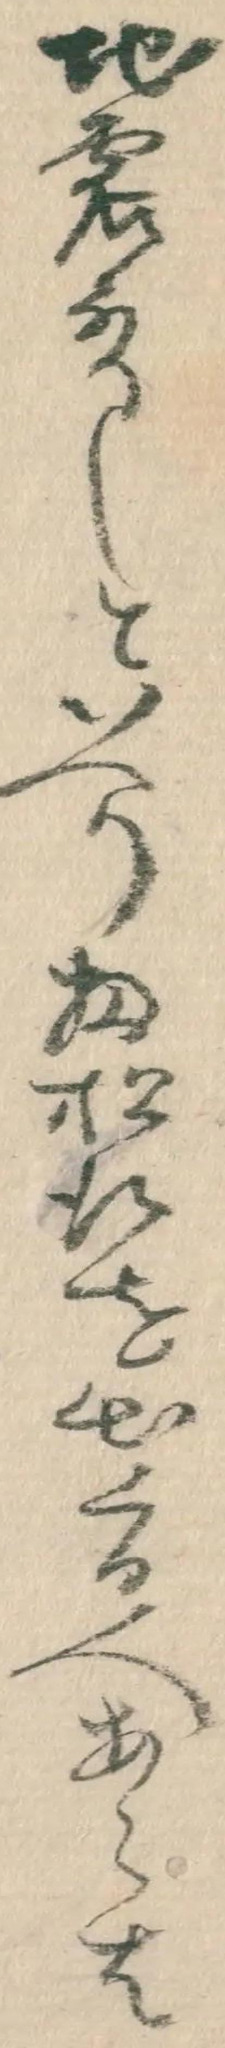地震なりしといへり扨松江を出くる人あらは

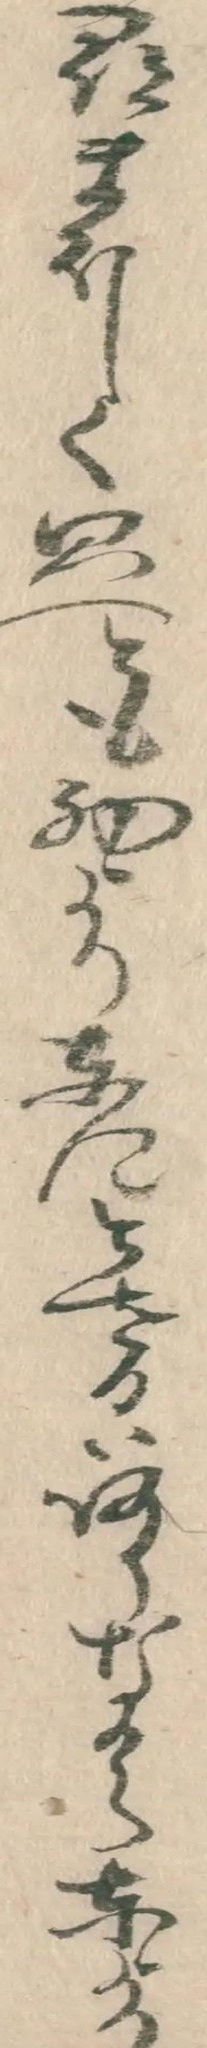尋まほしく思へとも西より東にとをるはありなから東より
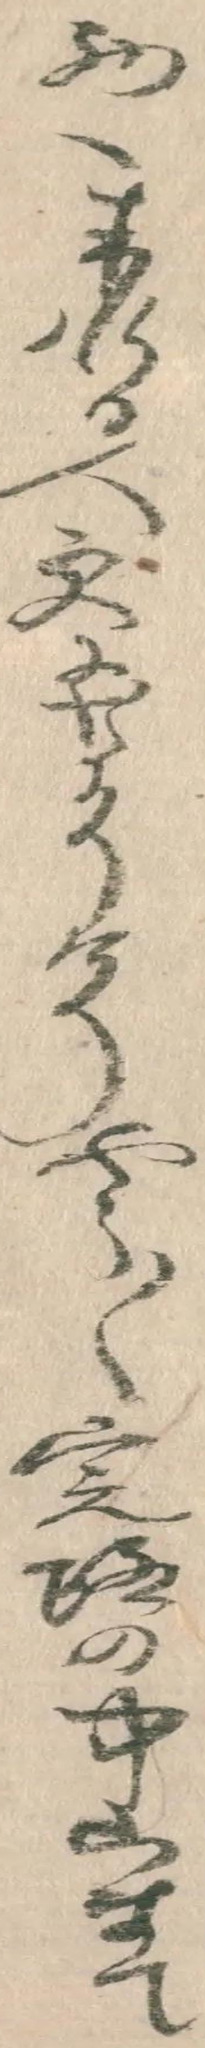西へ来れる人更になかりけりやう〳〵完路の中山まて
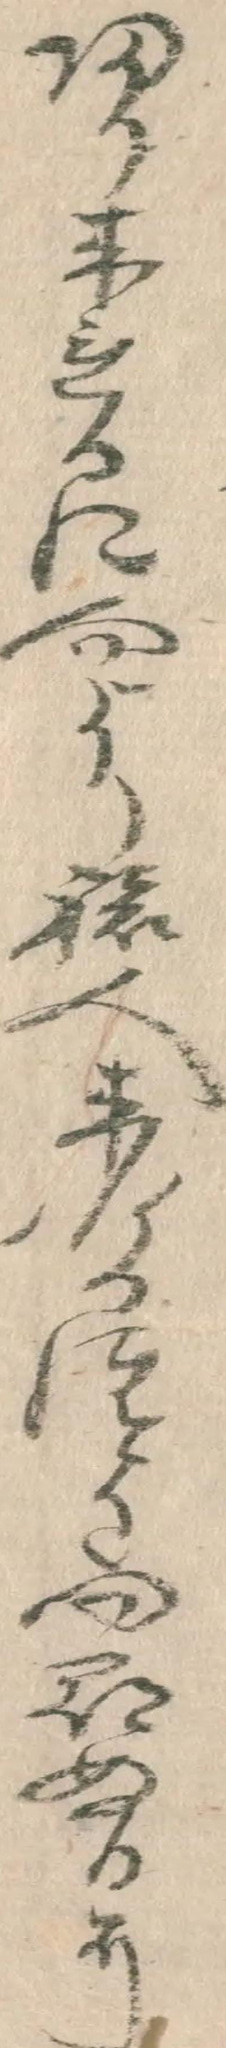帰り来れるに向より旅人来れるほとに問尋ぬるに
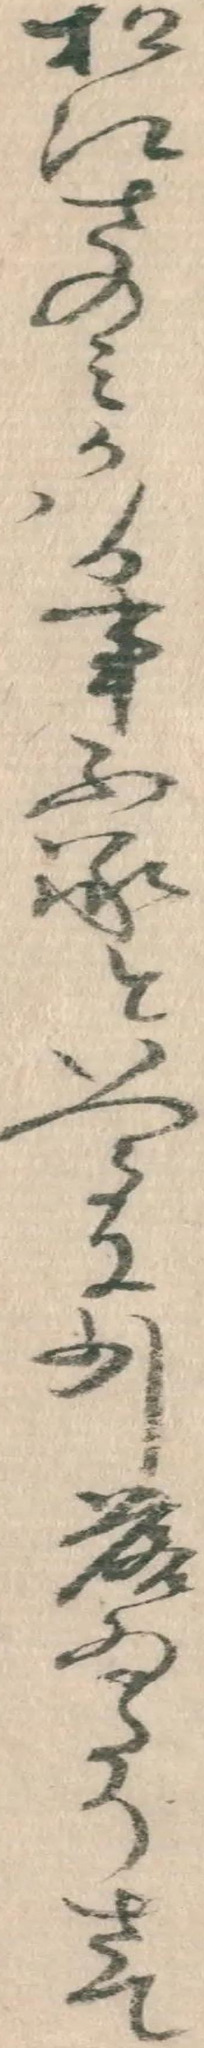松江さのみかはる事不承といへるに少し落ゐたりさて
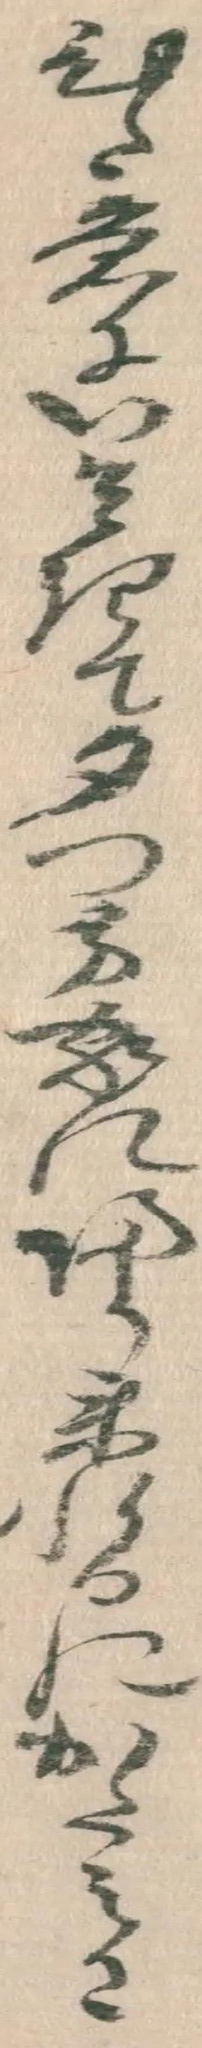ひた急にいそきて夕つ方家に帰り来れるにかたみに
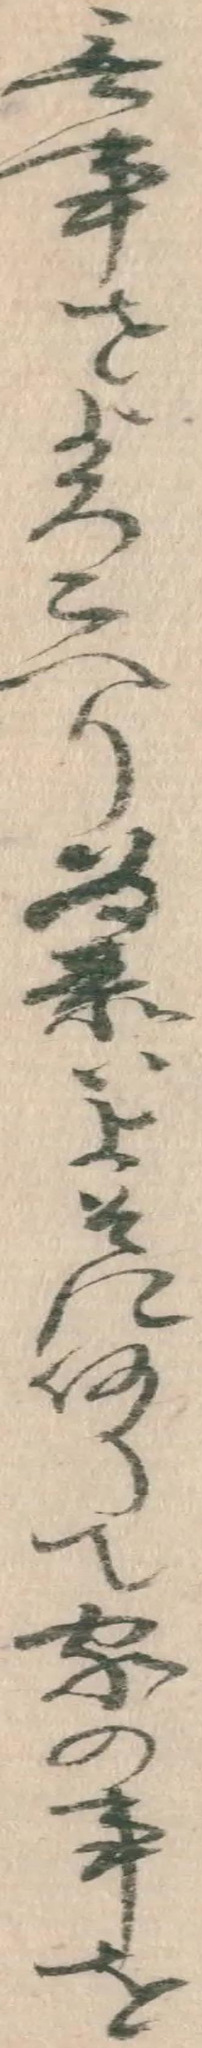無事をよろこへり為泰はよそにありて家の事を
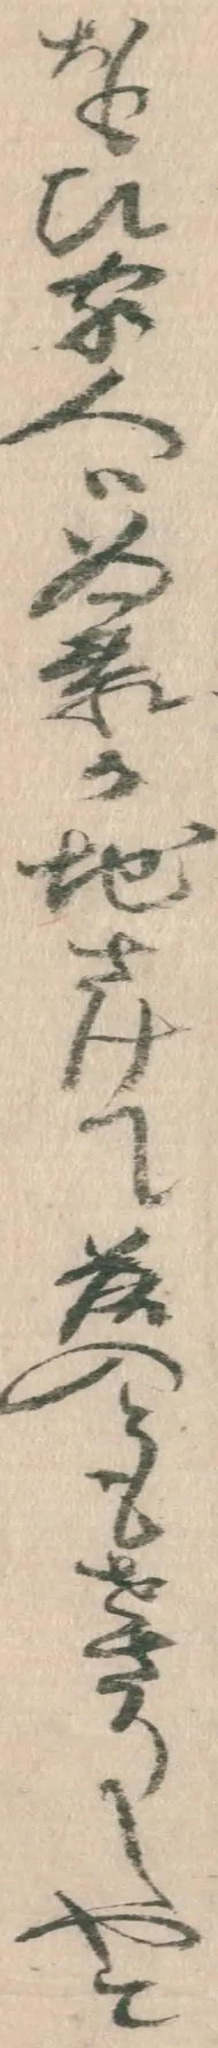おもひ家人は為泰か地さけて落入ともせさりしやと
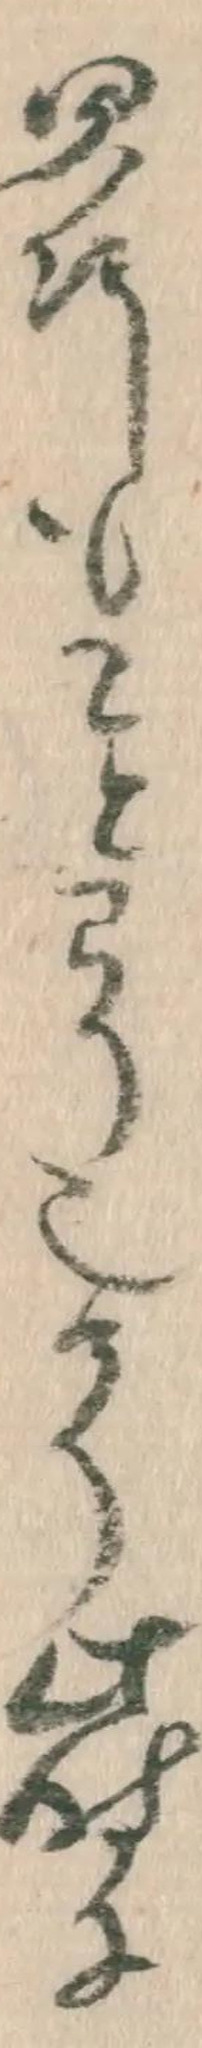思ひしもことわり也けり此時に
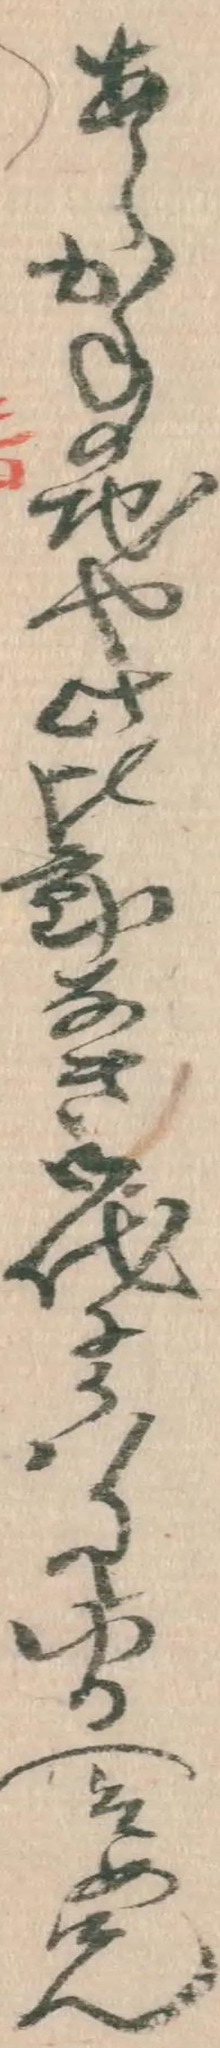あらかねの地や此頃動なき御代にかはりてゆるへそめけん
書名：出雲紀行. 20
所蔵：国立国会図書館 National Diet Library, JAPAN
